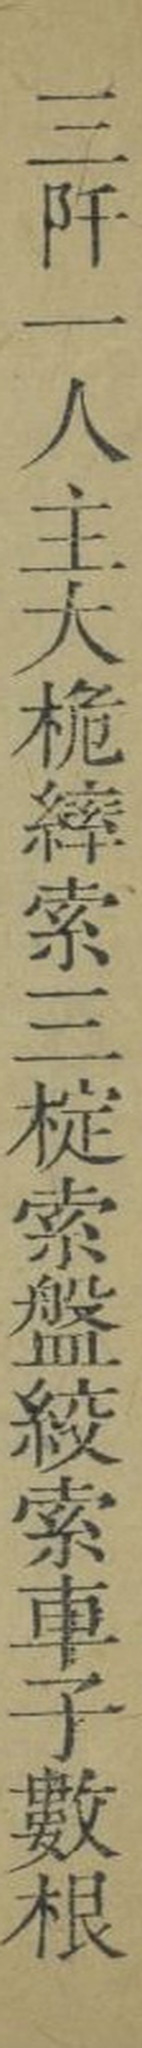三阡一人主大桅繂索三椗索盤絞索車子數根
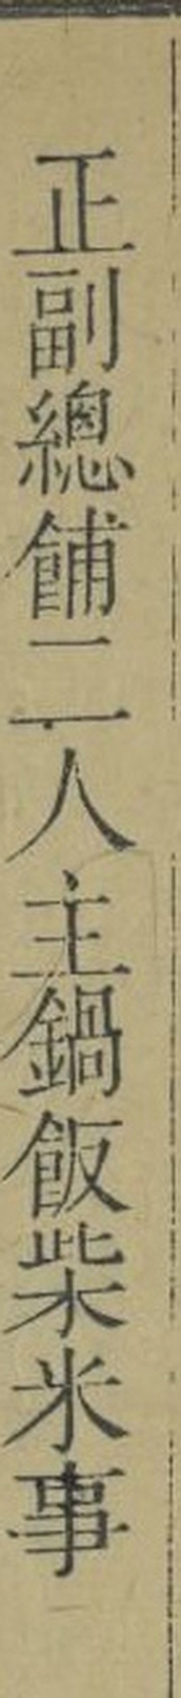正副總餔二人主鍋飯柴米事
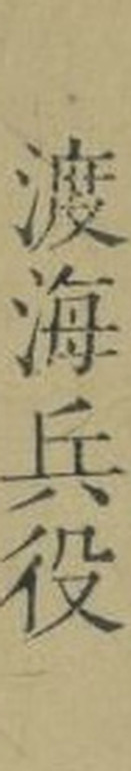渡海兵役
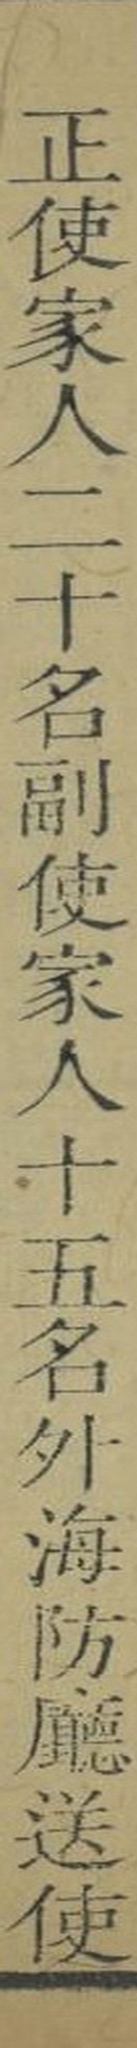正使家人二十名副使家人十五名外海防㕔送使
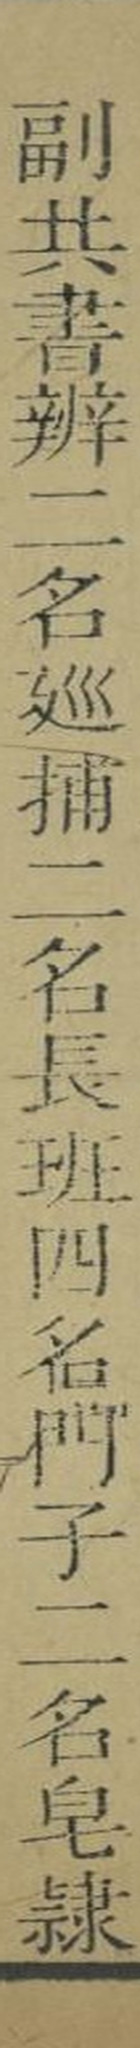副共書辨二名廵捕二名長班四名門子二名皂隷
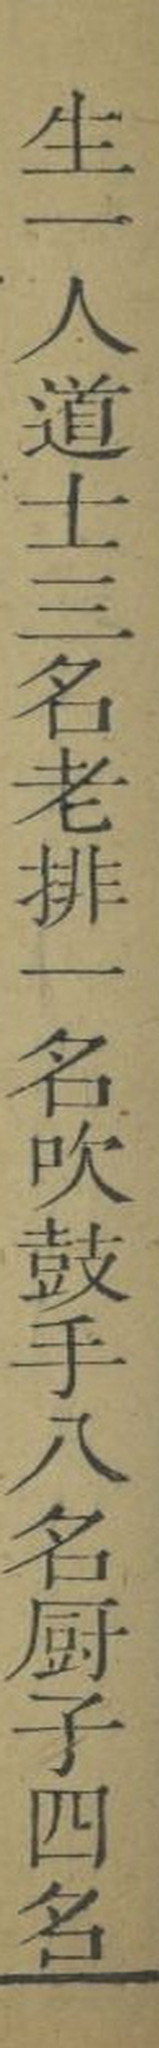生一人道士三名老排一名吹鼓手八名厨子四名
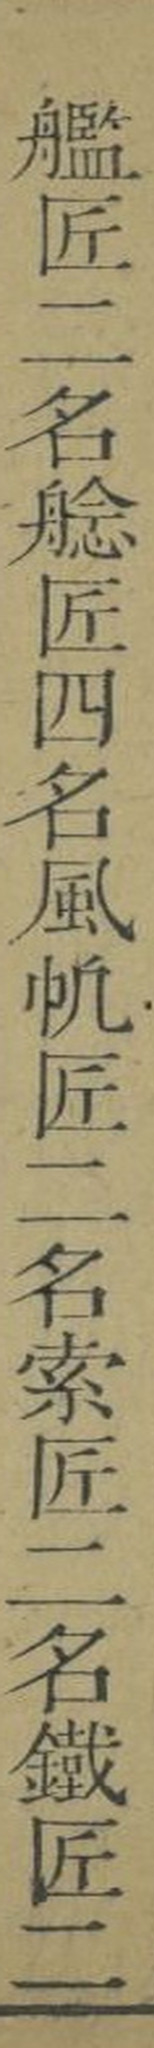艦匠二名艌匠四名風帆匠二名索匠二名鐵匠二
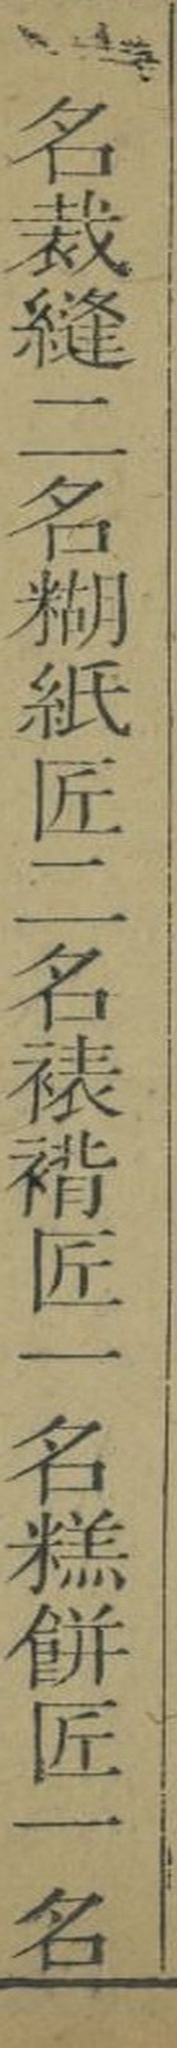名裁縫二名糊紙匠二名裱褙匠一名糕餅匠一名

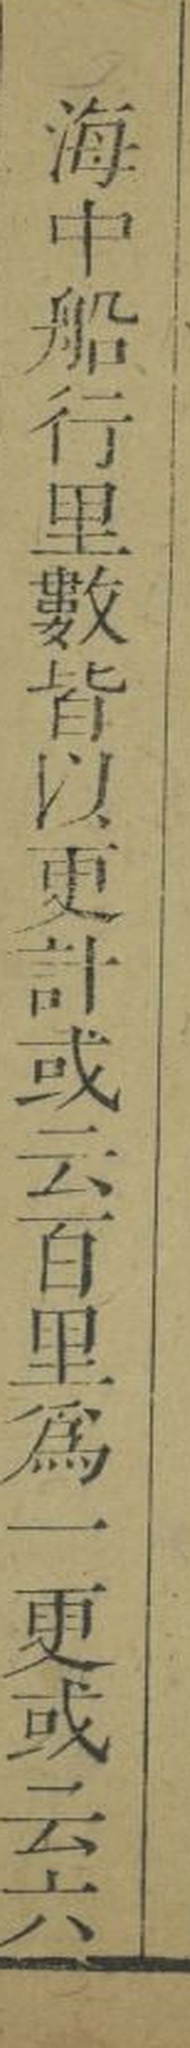海中船行里數皆以更計或云百里爲一更或云六
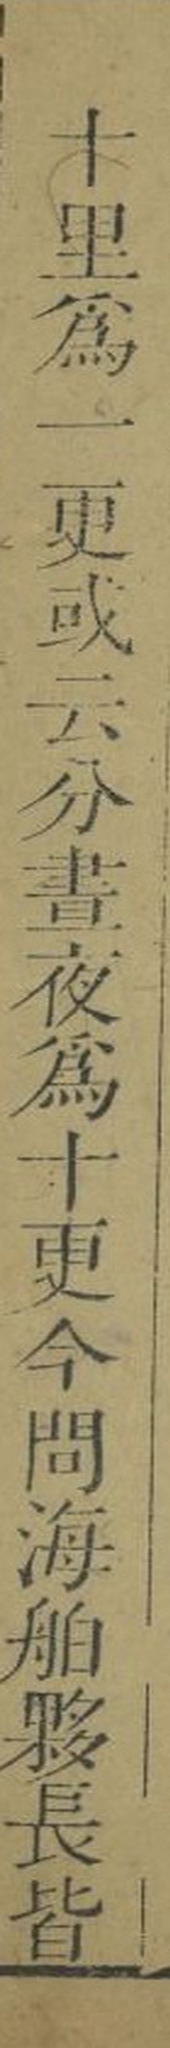十里爲一更或云分晝夜爲十更今問海舶夥長皆
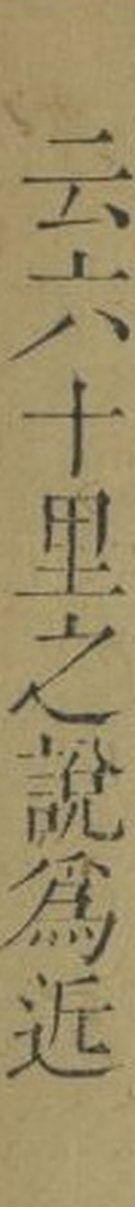云六十里之說爲近

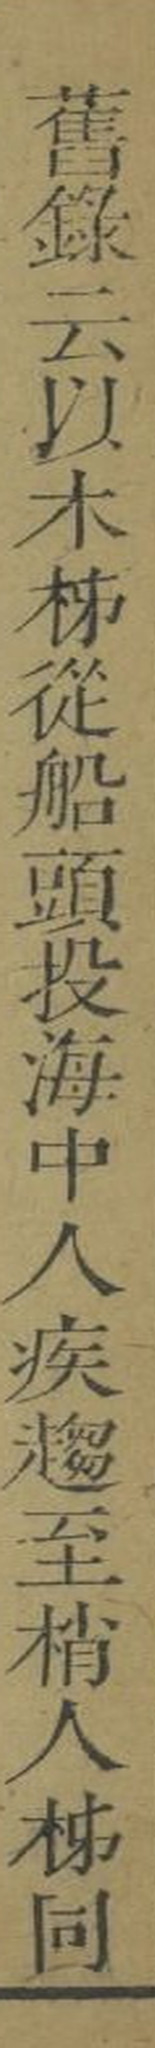舊錄云以木柹從船頭投海中人疾趨至梢人柹同
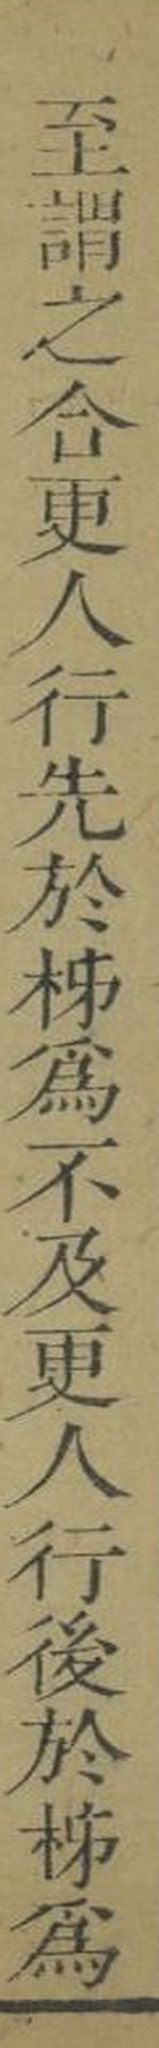至謂之合更人行先於柹爲不及更人行後於柹爲
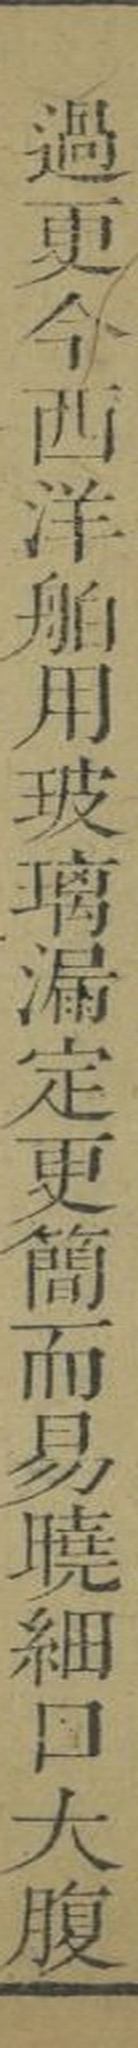過更今西洋舶用玻璃漏定更簡而易曉細口大腹
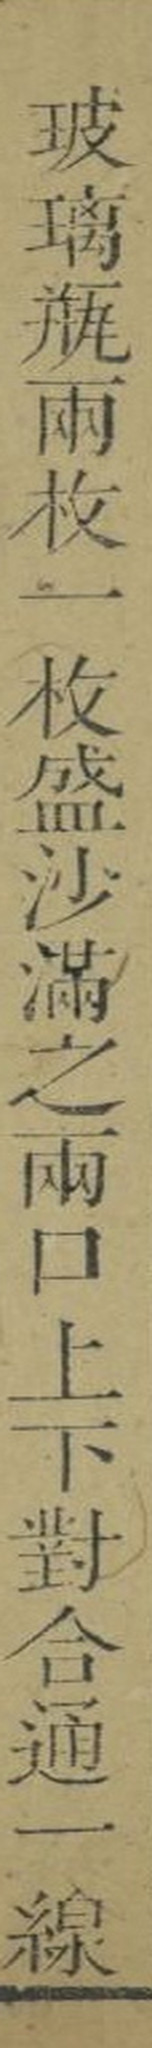玻璃瓶兩枚一枚盛沙滿之兩口上下對合通一線
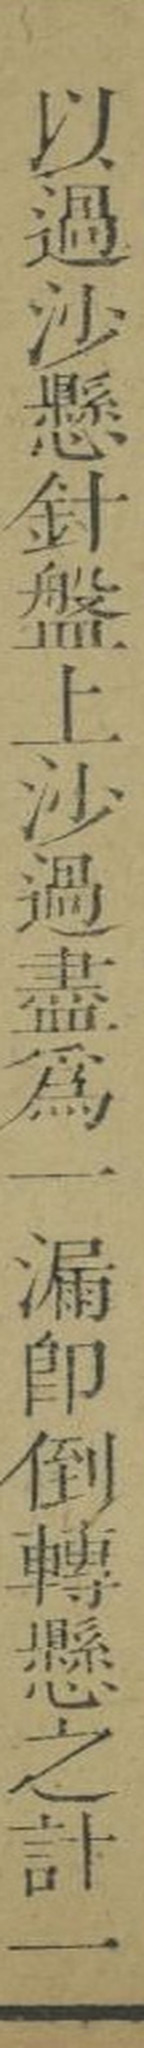以過沙懸針盤上沙過盡爲一漏卽倒轉懸之計一
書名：中山伝信録 巻一
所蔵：University of the Ryukyus Library
